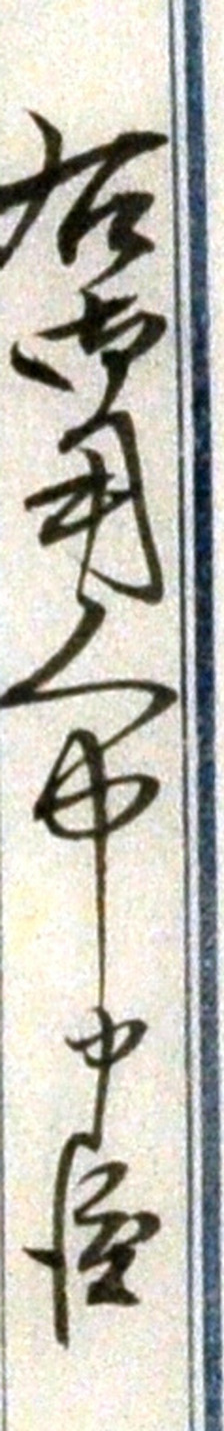右御用人中申渡
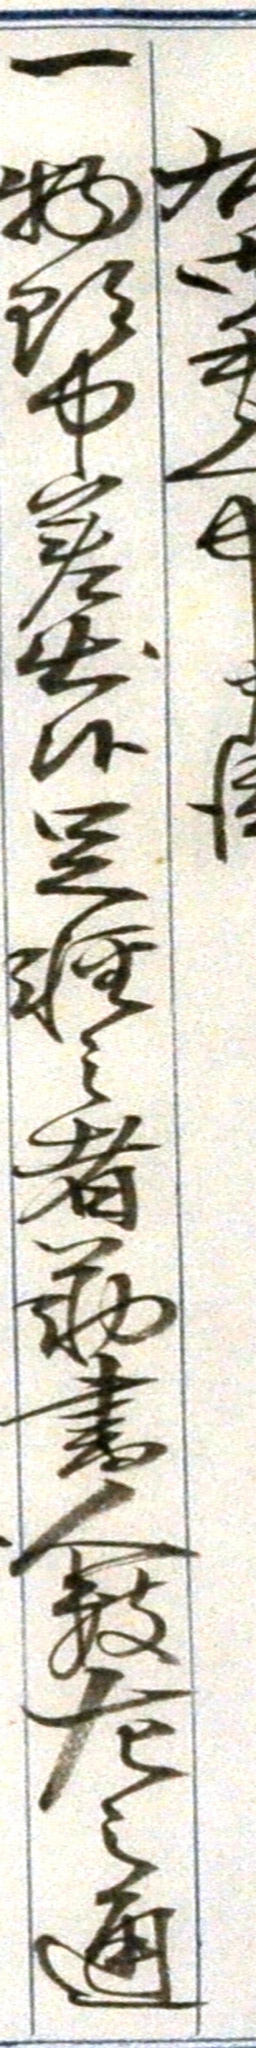一物頭中差出候足軽之者勤書人数左之通
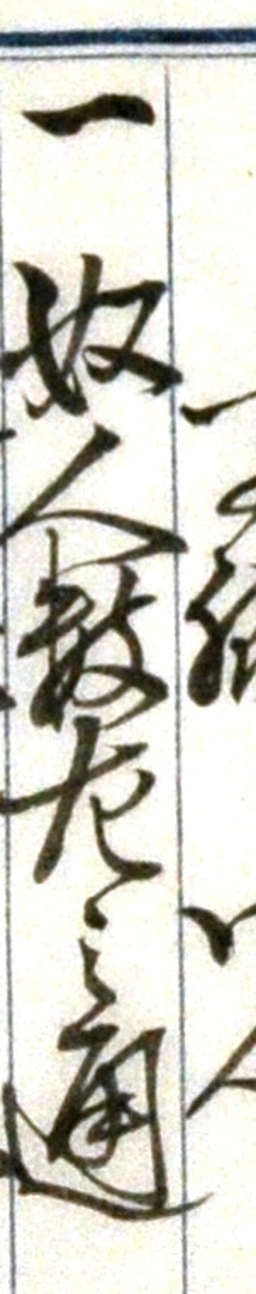一奴人数左之通
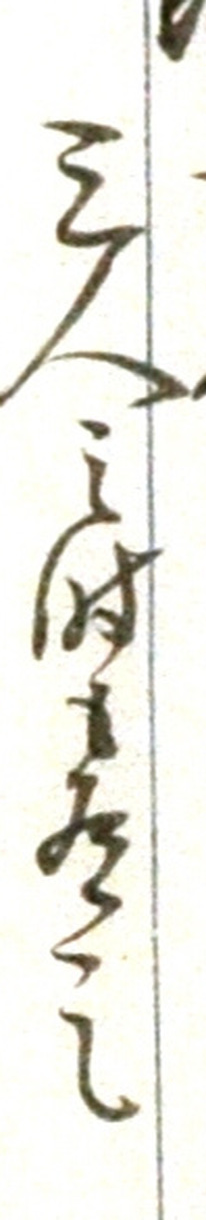三人之時も有之

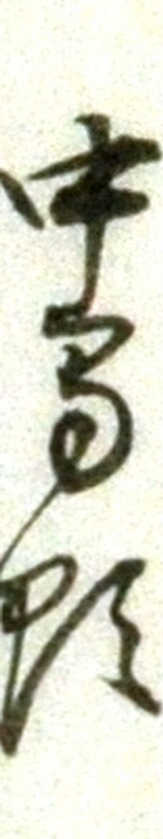中間頭
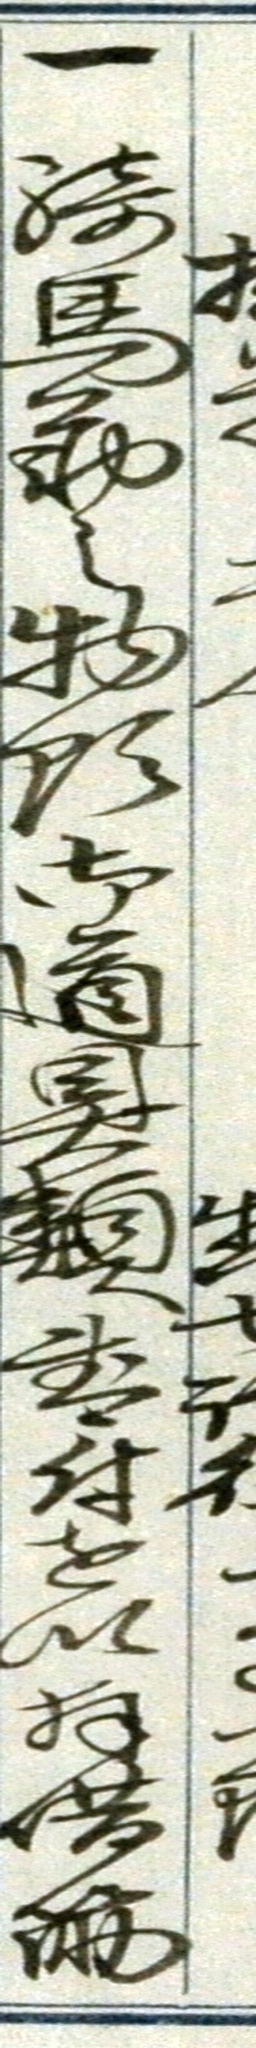一騎馬勤之物頭御道具類書付を以拝借筋
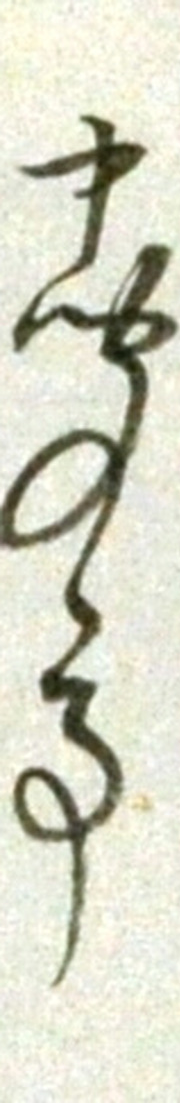申聞候事
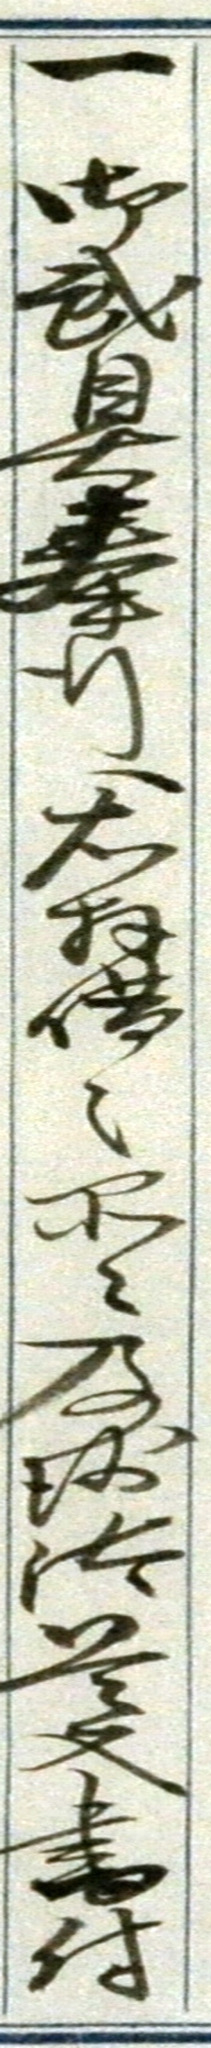一御武具奉行へ右拝借之品々及沙汰是又書付
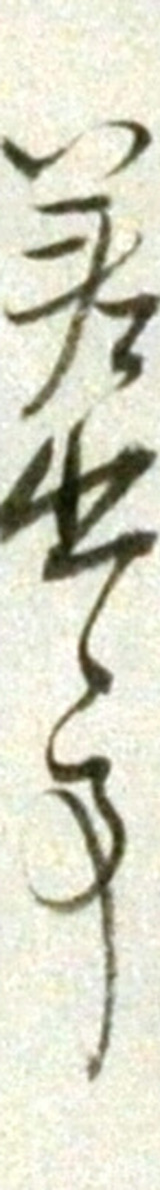差出候事
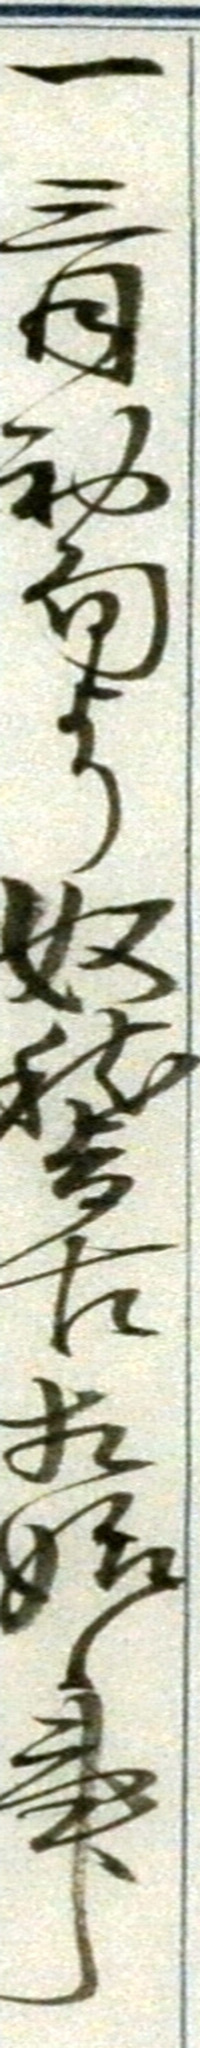一三月初旬より奴稽古相始候事
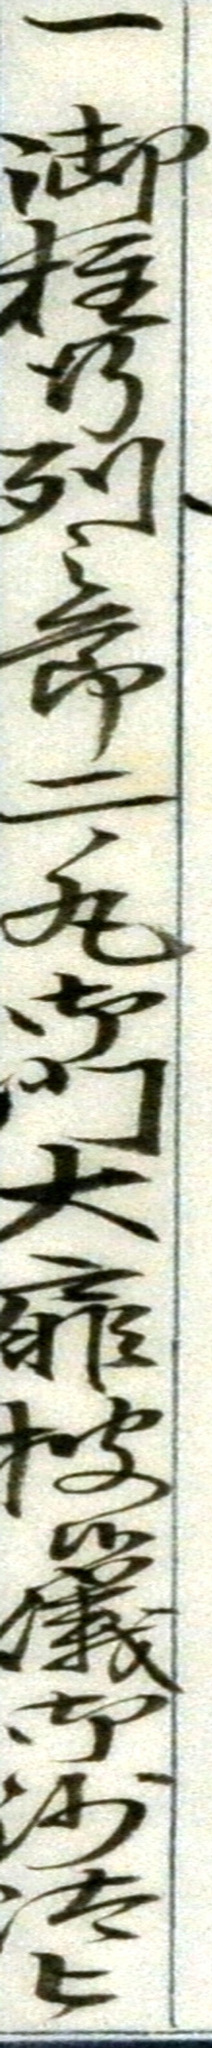一御柱行列之節二ノ丸御門大扉披候儀御沙汰被
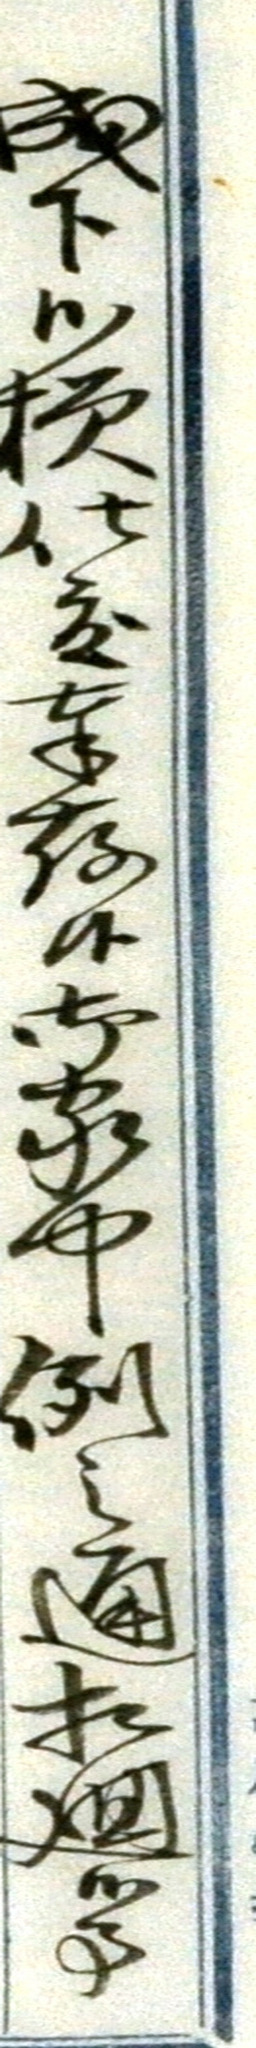成下候様仕度奉存候御家中例之通相廻候事
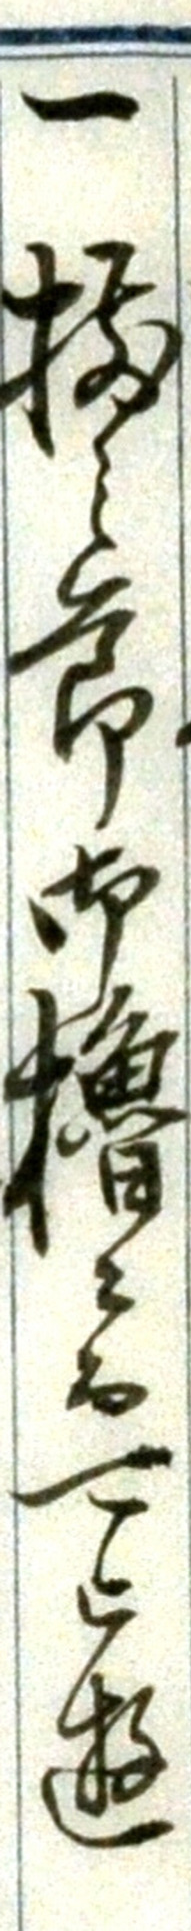一揃之節御櫓ニ而可被遊
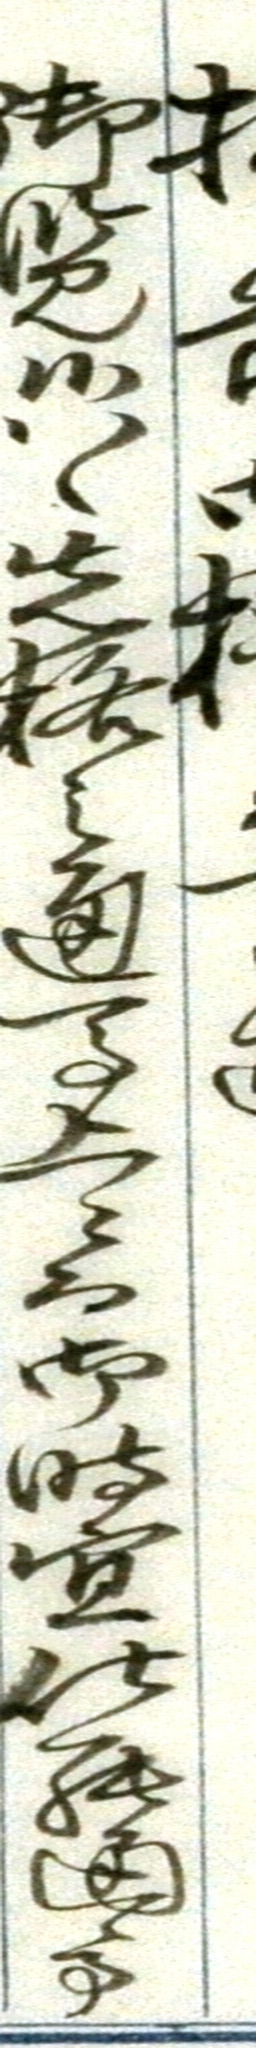御覧候ハヽ先格之通馬上ニ而御時宜仕罷通候事
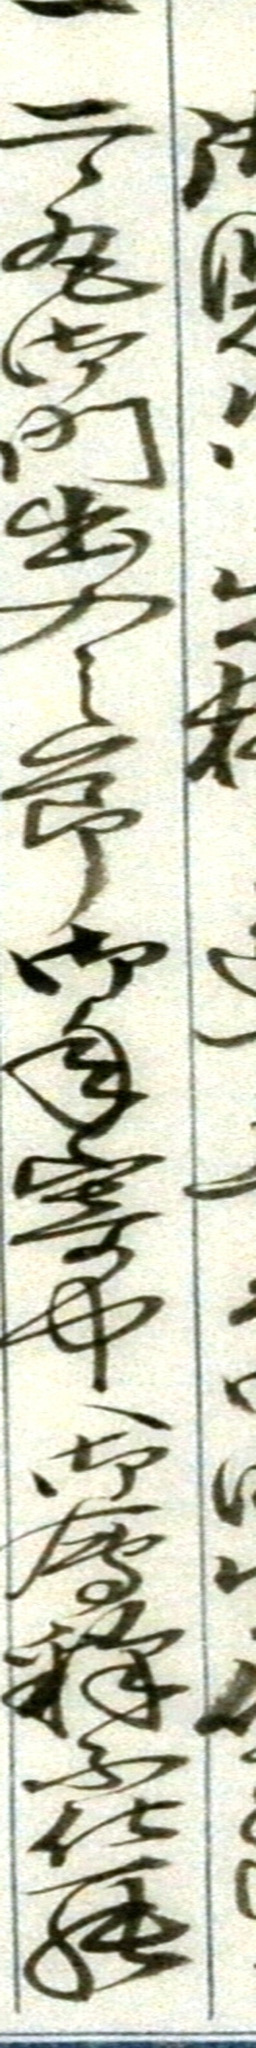一二ノ丸御門出入之節御年寄中へ御会釈不仕罷
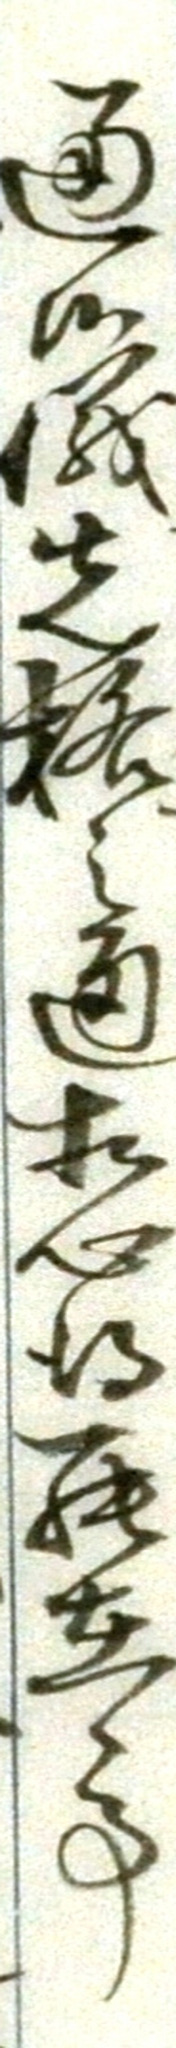通候儀先格之通相心得罷在候事
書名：諏訪御柱祭之節・騎馬大将御中間頭・御柱引人足
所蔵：伊那市立高遠町図書館・合同会社AMANE
